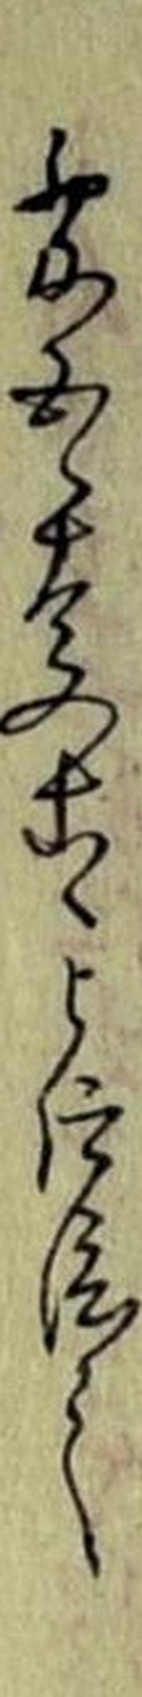栗五郎大夫等へ被仰渡之
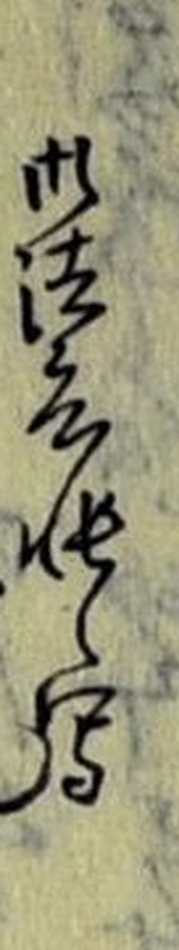御法度帳之写
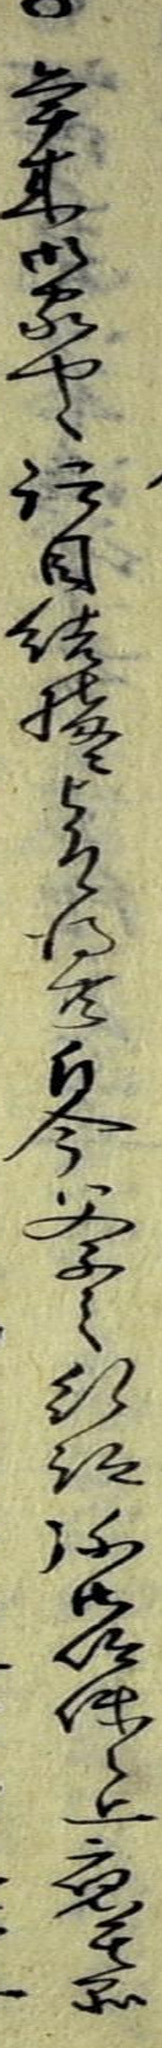〇年来御家中へ跡目結構ニ被下候得共自今父子之行跡弥御吟味之上応其品
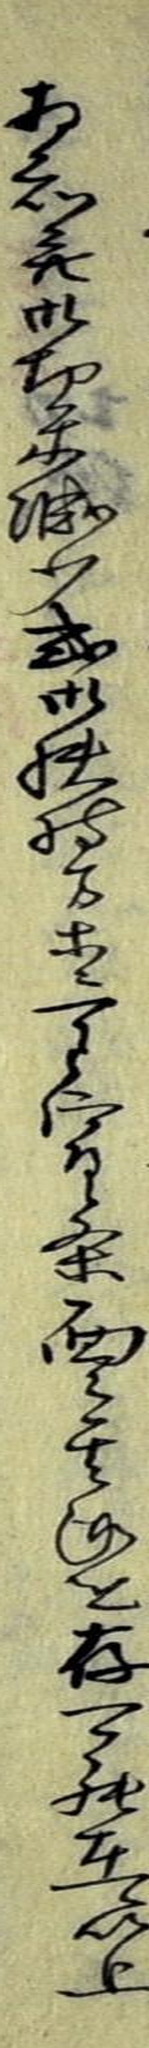拝知并御切米減少或御扶持方等ニ可被仰付候条面々其趣を存可罷在候以上
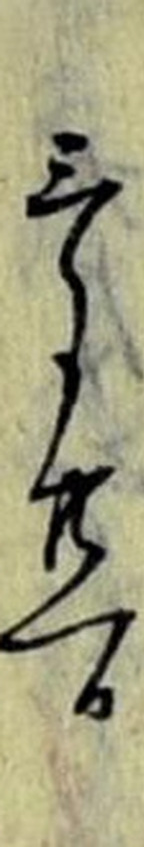三月廿一日
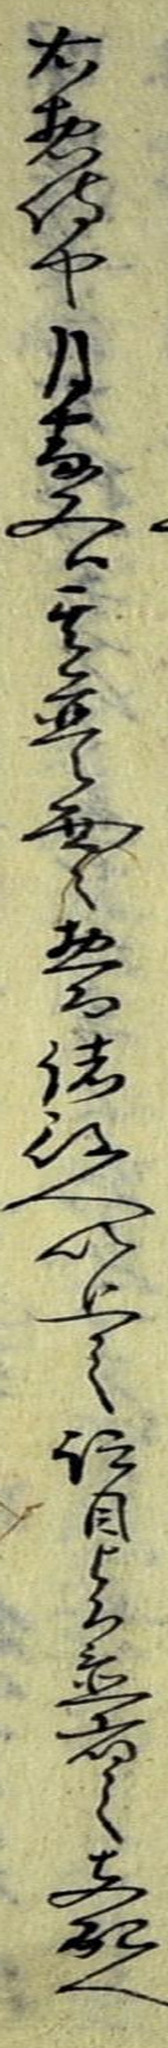右惣侍中月番又ハ其並之面々惣而諸役人以上之跡目被下置者之支配人
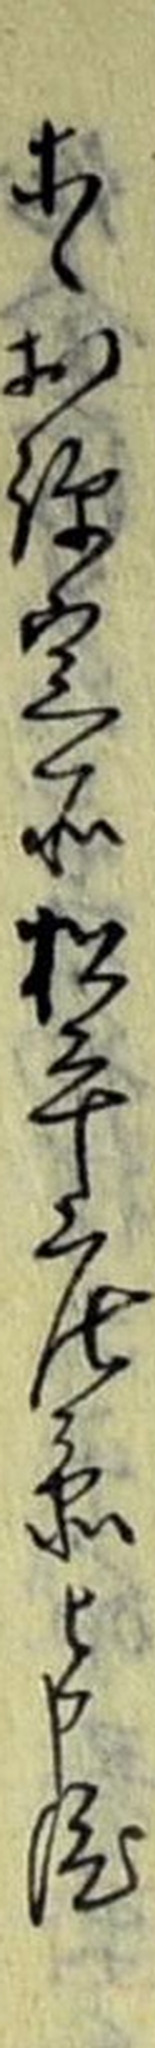等へ於評定所松平庄兵衛被申渡

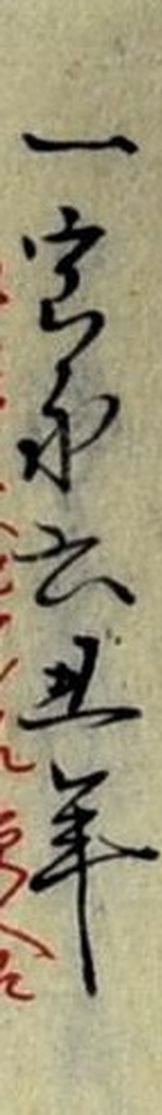一宝永六丑年
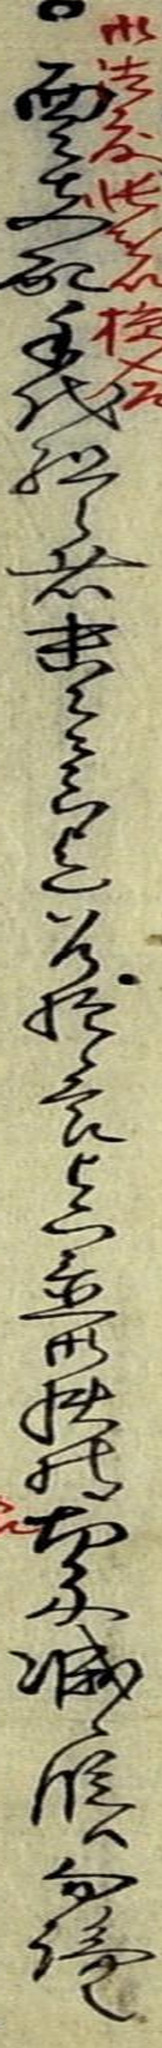〇面々支配手代組之者末々ニ至迄召抱候節被下置御扶持切米減候段ハ勿論之
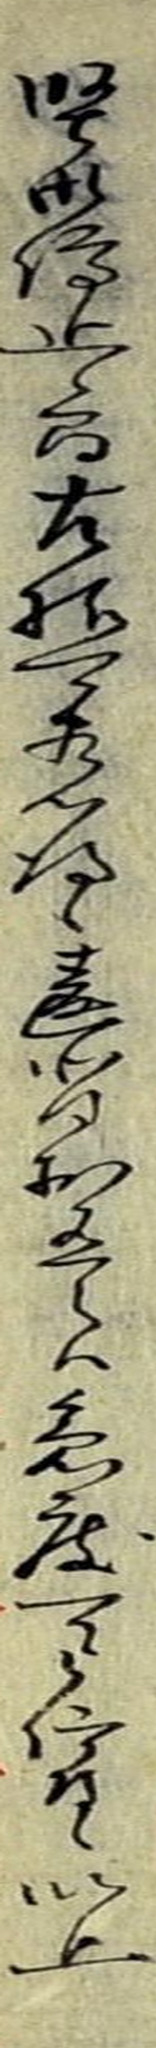堅御停止候間左様可相心得候違背於有之ハ急度可被仰付候以上
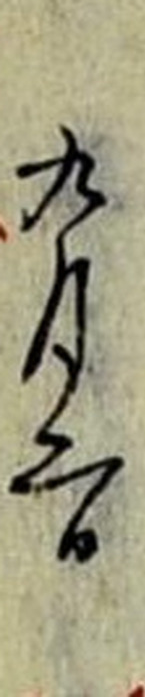九月二日
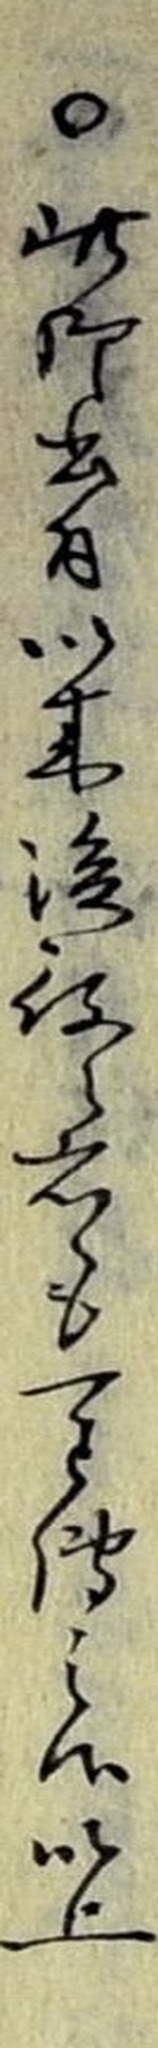〇此御書付以来後役之者へも可被伝之候以上
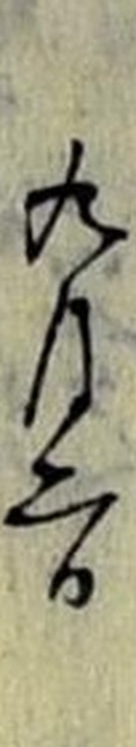九月二日
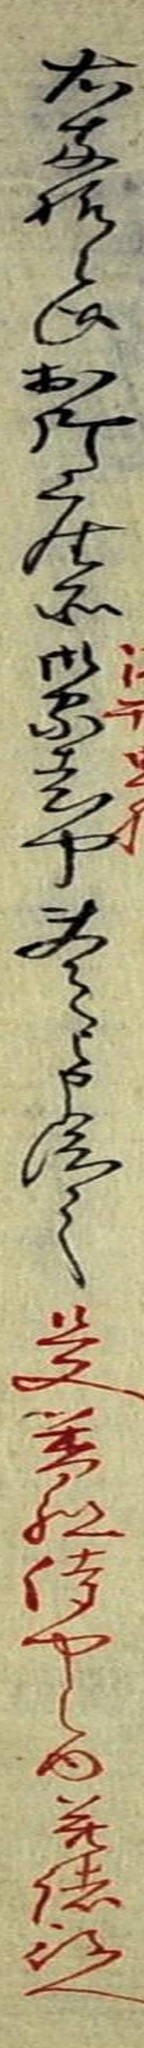右両様之趣於御座所御家老中酒井典膳夫々へ被申渡之且又番組侍中之内并諸役人
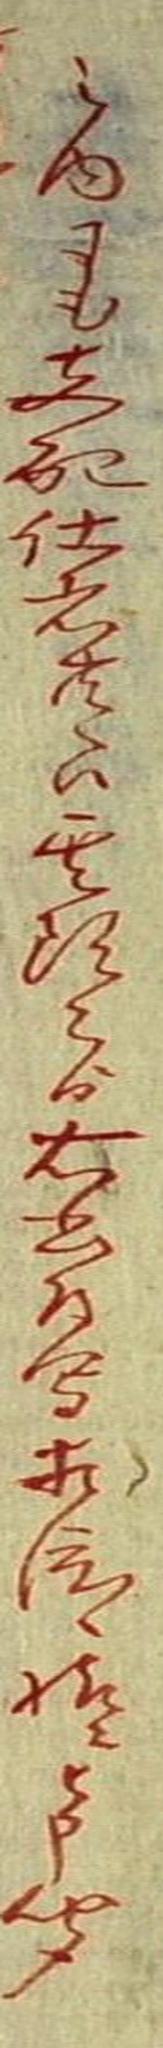之内にも支配仕者共ヘハ其頭々ゟ右書付写相渡候様ニ被申聞
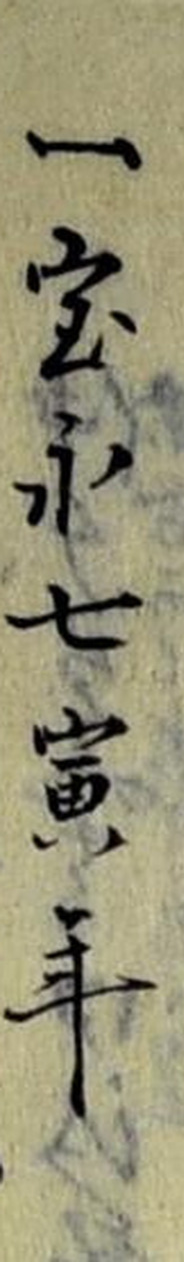一宝永七寅年
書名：命令之部 一
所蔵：福井県文書館 Fukui Prefectural Archives
